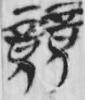競
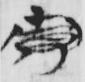賈
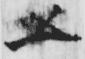之
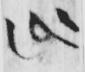州
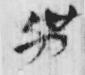加
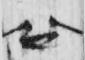公
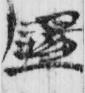○（陽）
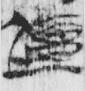疆
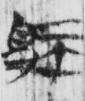馭（御）
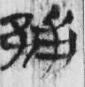郙
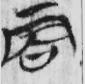丙
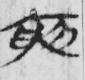寅
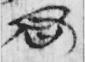君
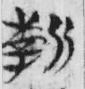新
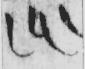州
